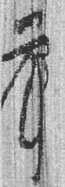而
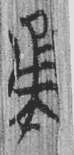用
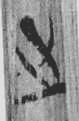之
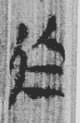於
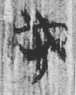四
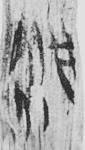海
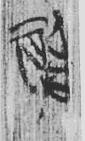䎽（問）
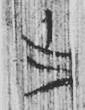之
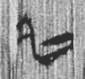○（曰）
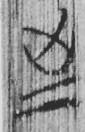至
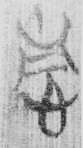情
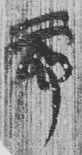而
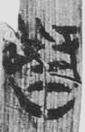智（知）
